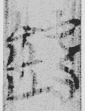欽（禁）
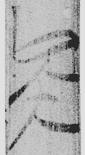矣
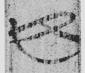女（如）
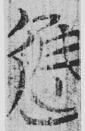進
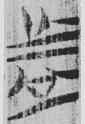者
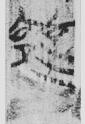雚（勸）
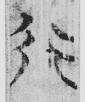行
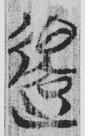退
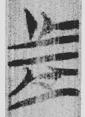者
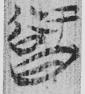智（知）
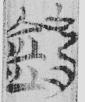欽（禁）
